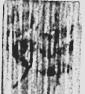邦
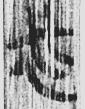必
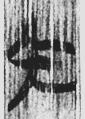內（入）
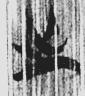之
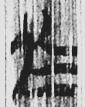於
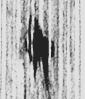十
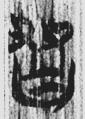○（友）
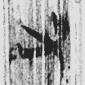又
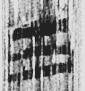三
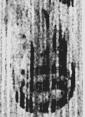皆
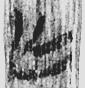亡
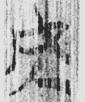𡚦
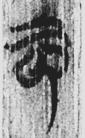而
